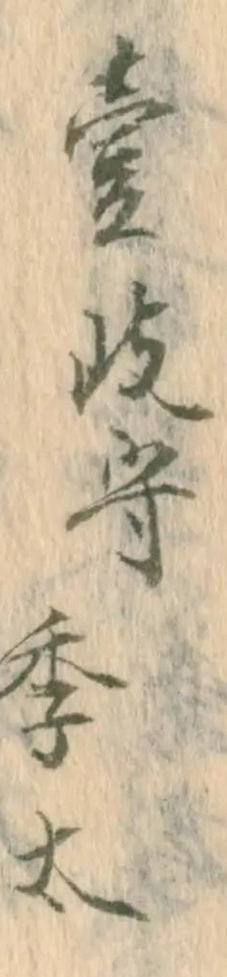壱岐守季太
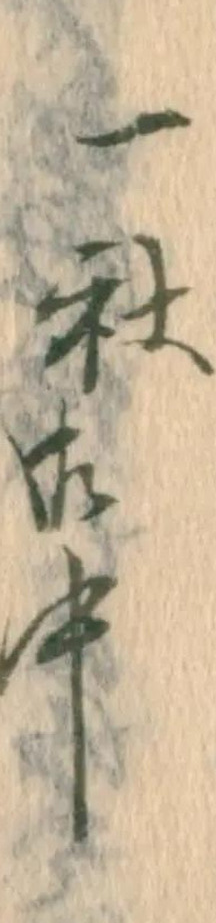一社御中
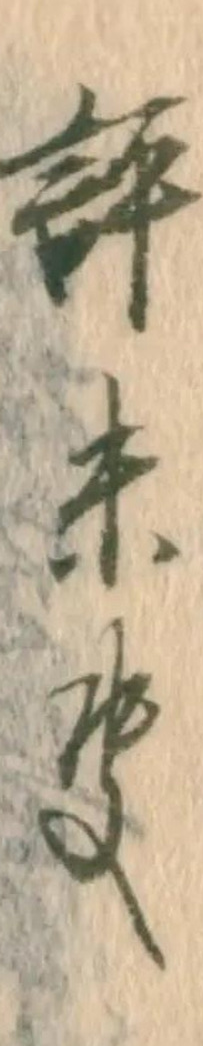評未決
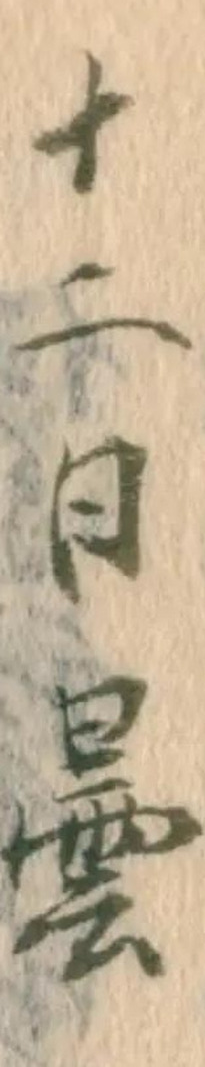十二日曇
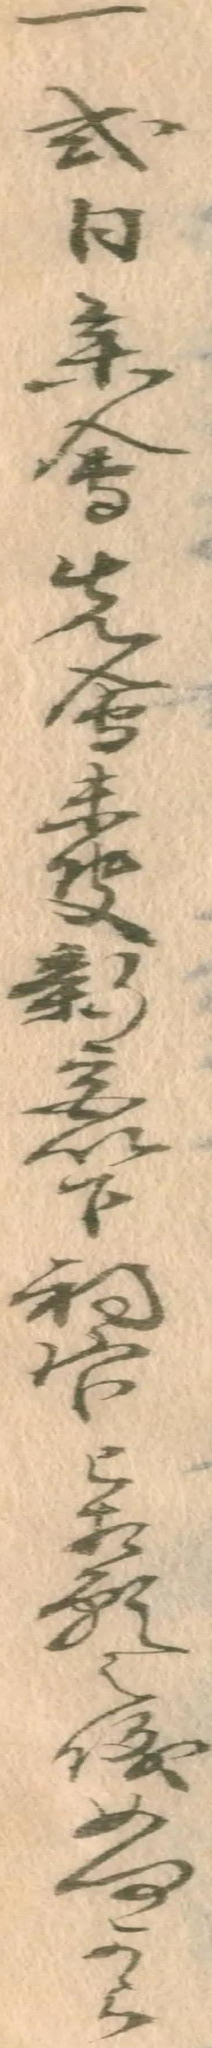一式日参会先会未決新宮以下祠官被相願之儀如何から
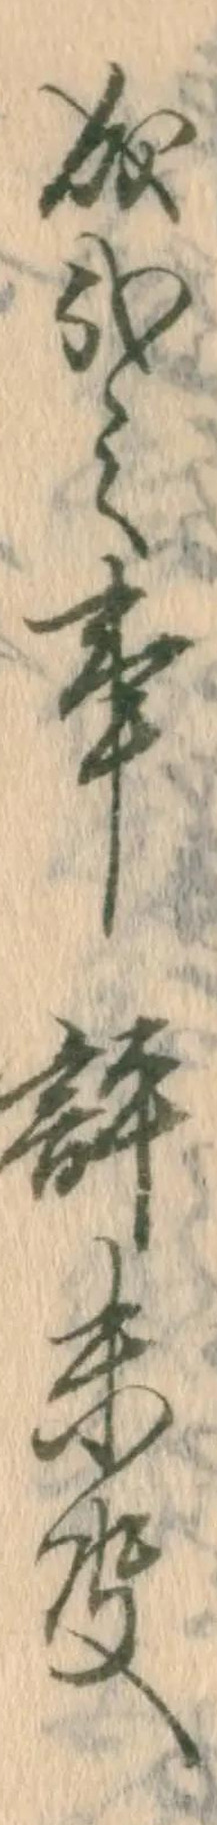成哉之事評未決
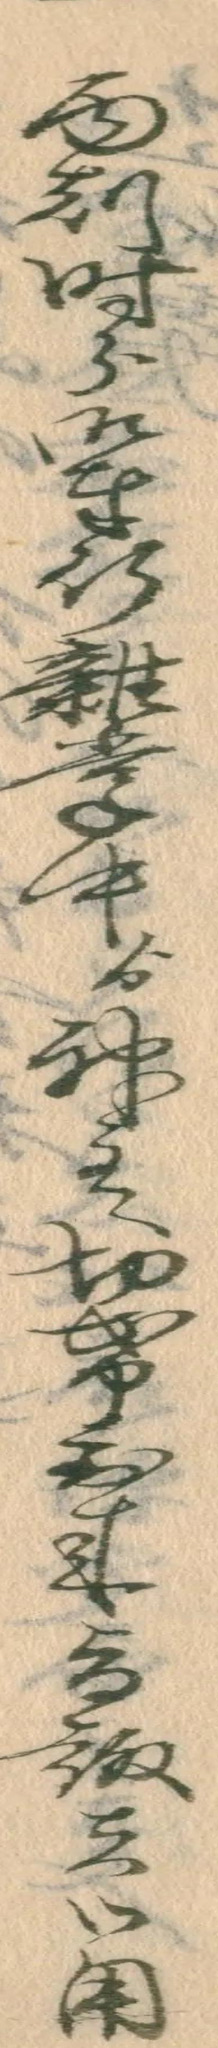一酉刻時分御奉行雑掌中ゟ神主へ切帋到来旨趣は御用
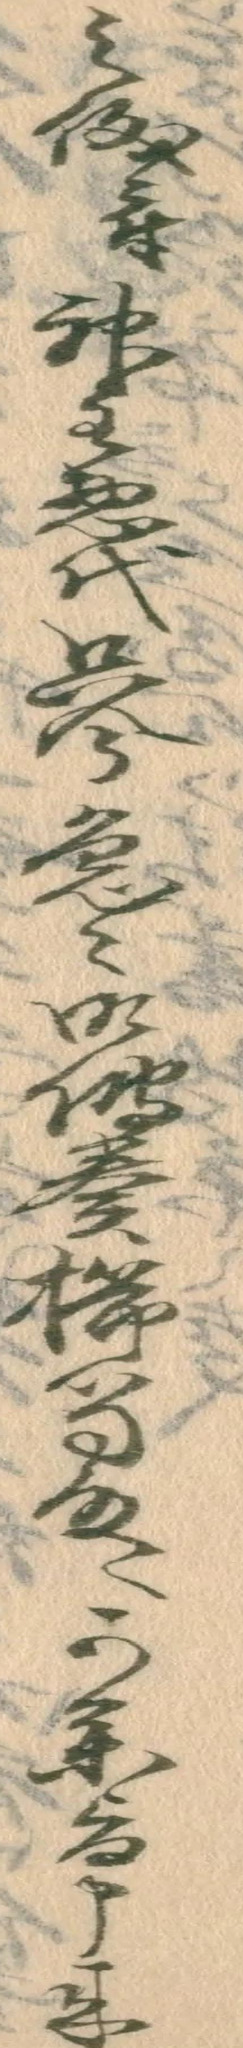之儀ニ付神主惣代只今急々御伝奏櫛笥殿へ可参旨申来
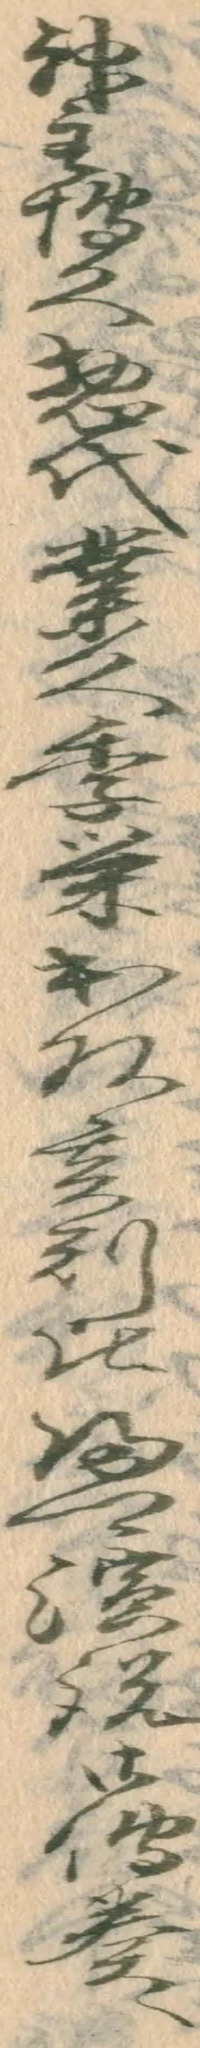神主博久惣代業久季栄出現亥刻比帰郷演説御伝奏へ
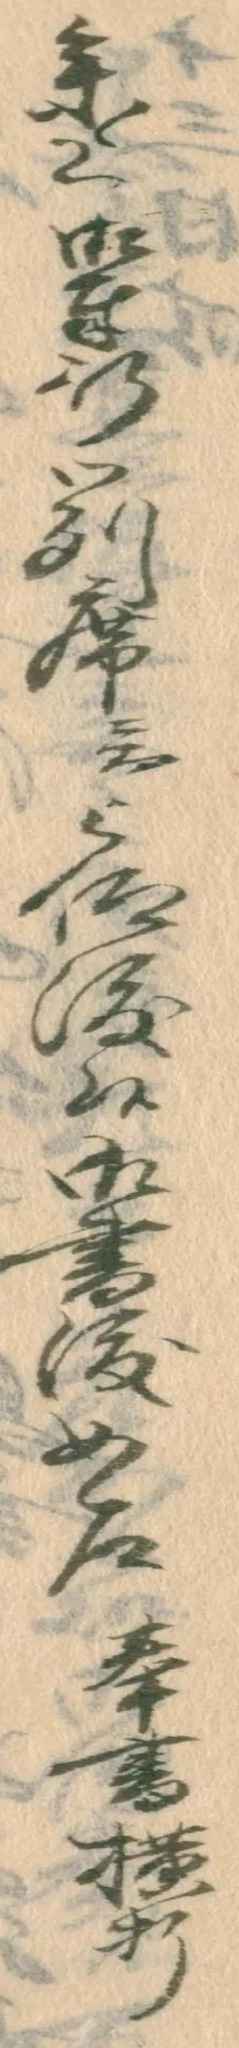参候ハ御奉行御列席に而被仰渡候御書渡如右奉書横折
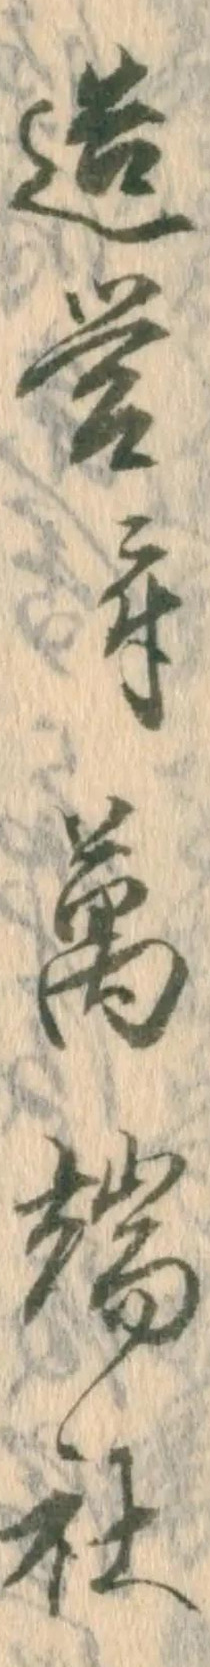造営ニ付万端社
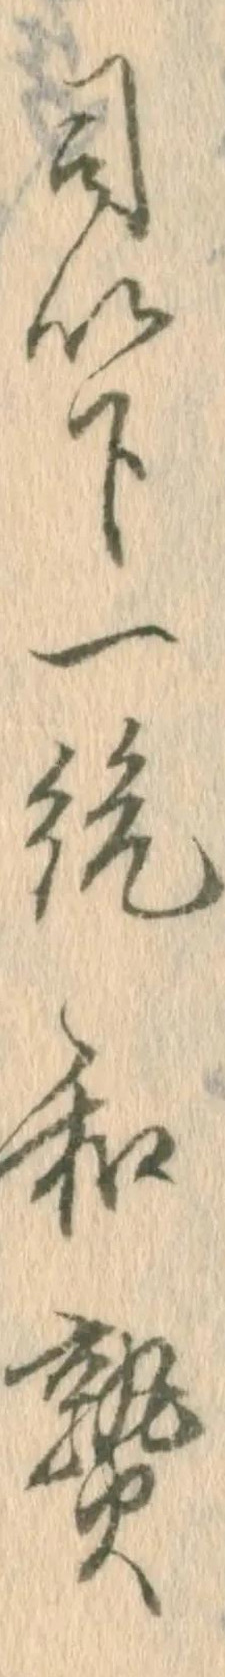司以下一統和熟
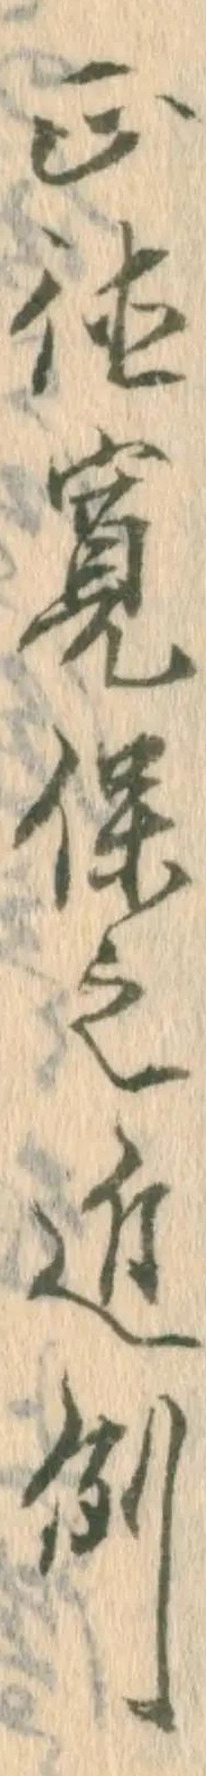正徳寛保之近例
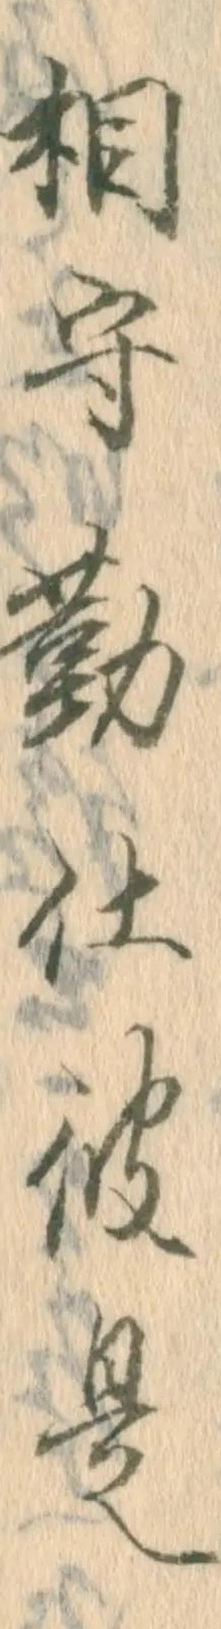相守勤仕彼是
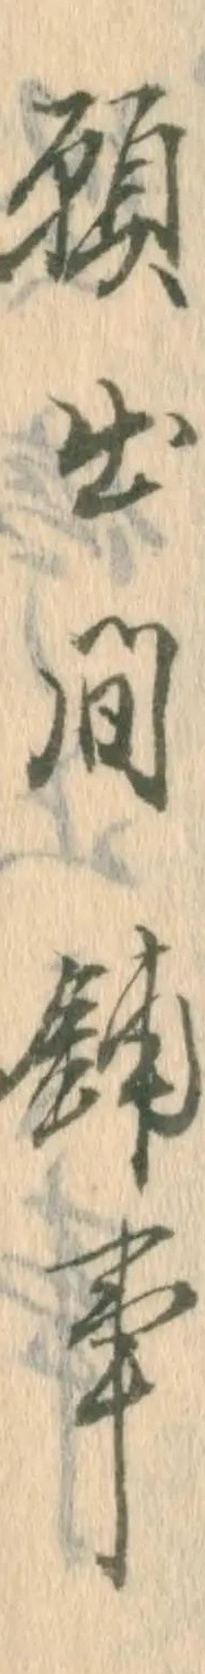願出間鋪事
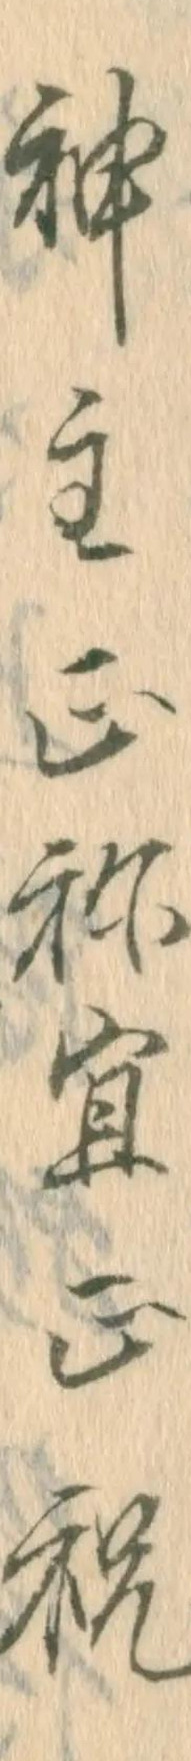神主正祢宜正祝
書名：賀茂社記録. 第17冊
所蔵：国立国会図書館 National Diet Library, JAPAN
